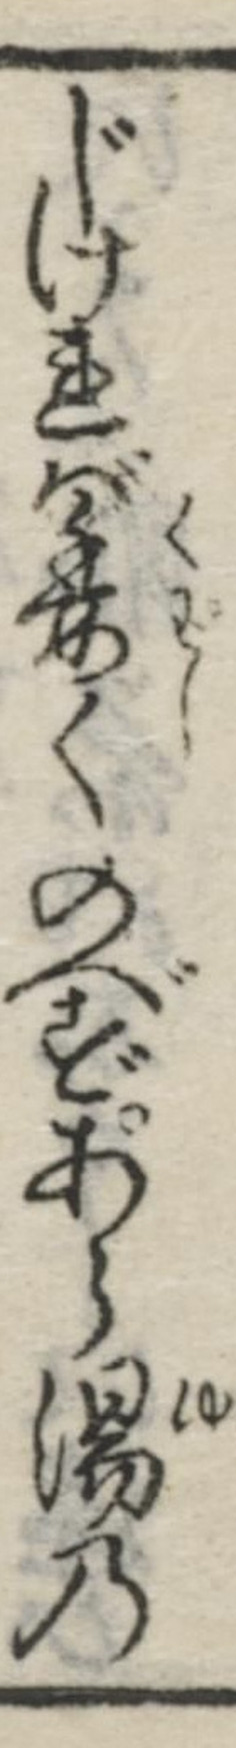じければ委くのべず。あら湯の
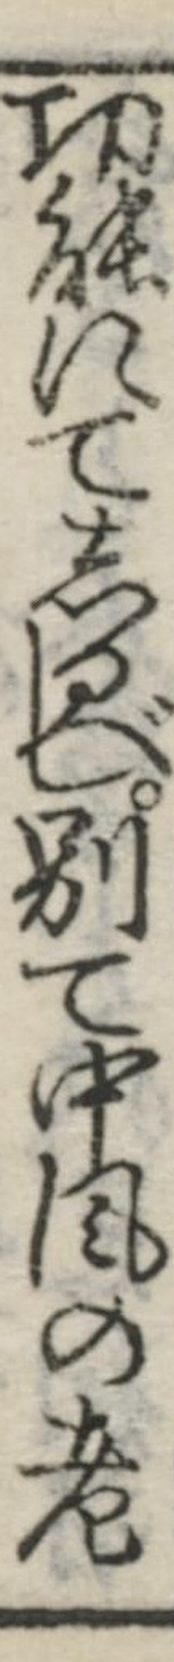功能にてしるべし。別て中風の老
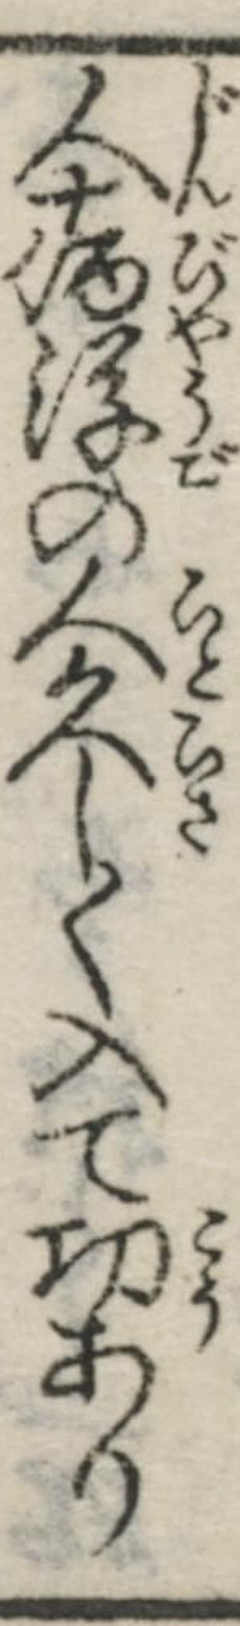人病後の人久しく入て功あり
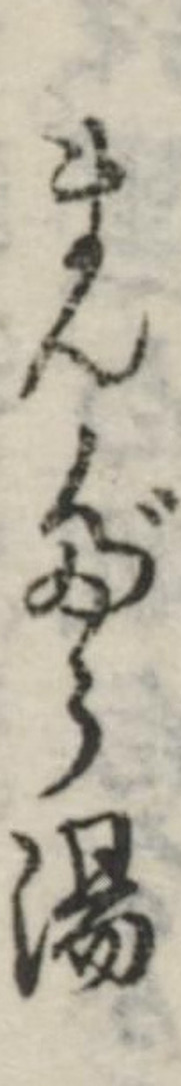まんだら湯
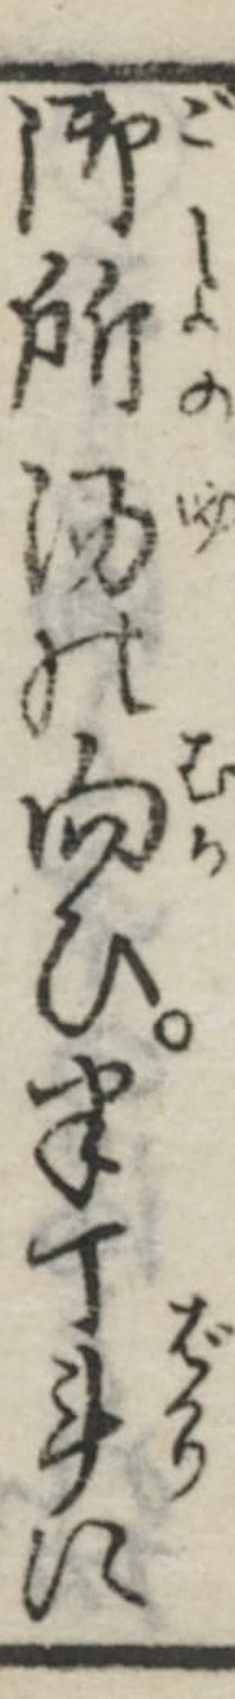御所湯向い。半丁斗に
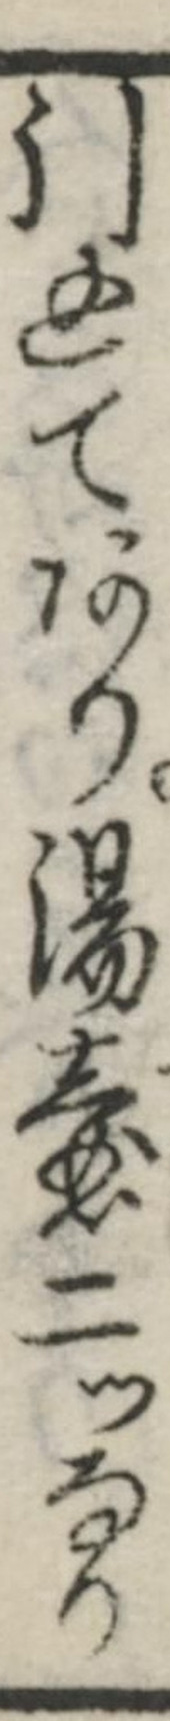引込てあり。湯壺二ツなり
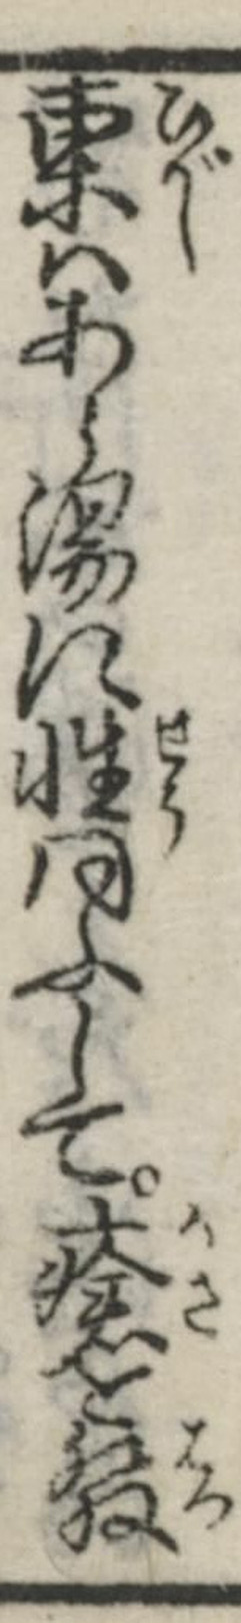東はあら湯に性同うして。瘡を発
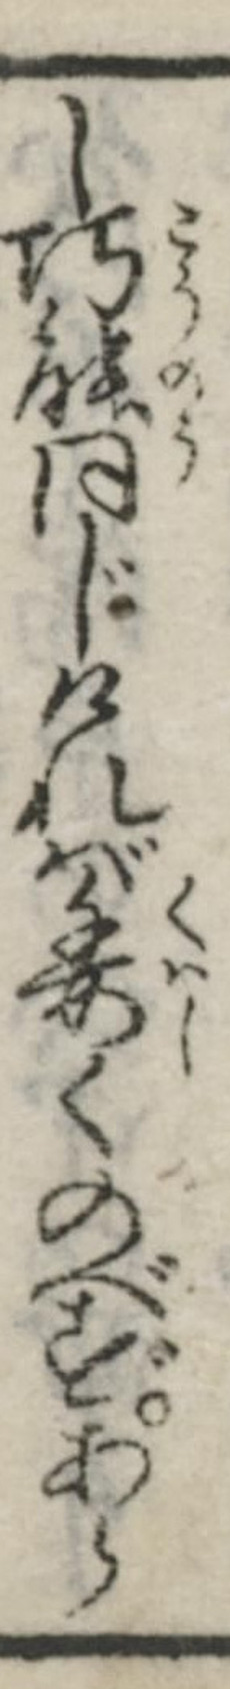し功能同じければ委くのべず。あら
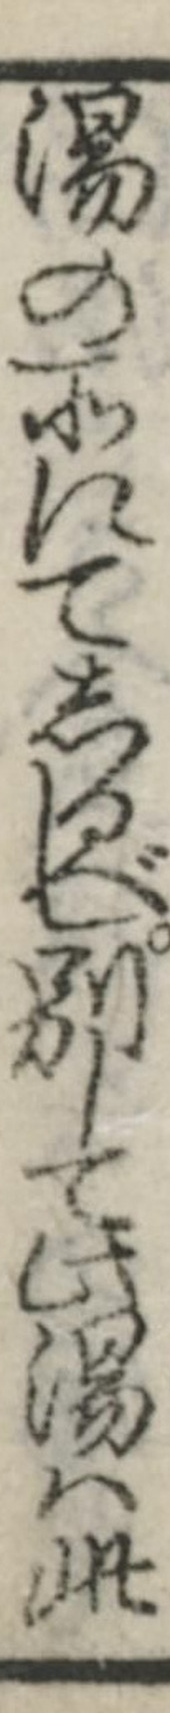湯の所にてしるべし。別して此湯は此
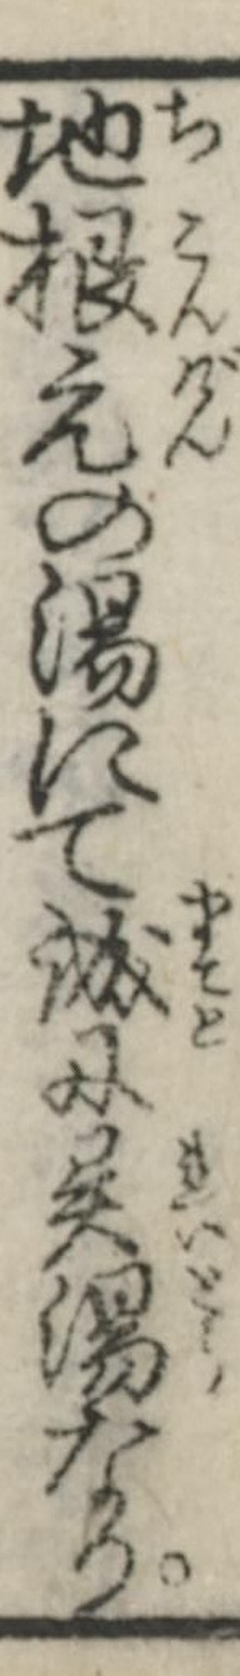地根元の湯にて誠に霊湯なり。
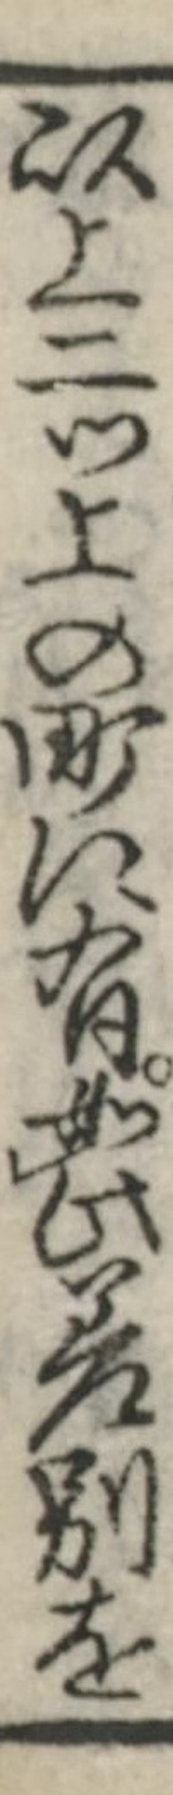以上二ツ上の町に有。如此差別を

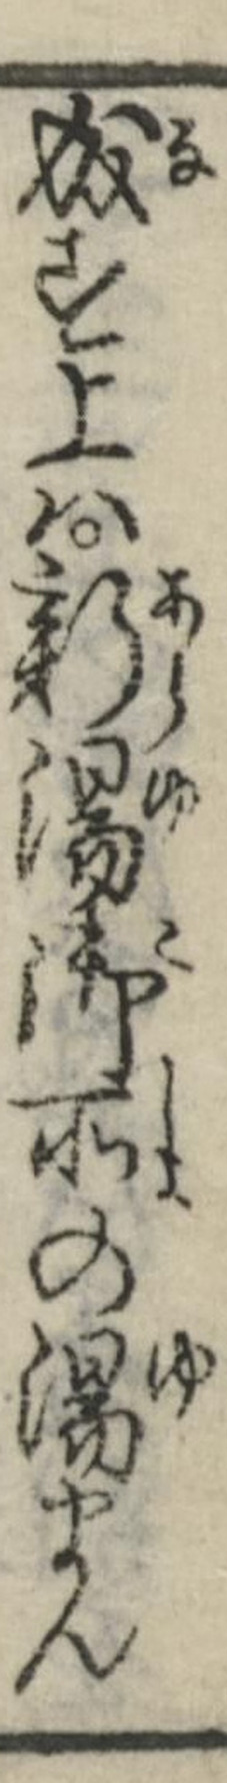成す上は。新湯御所の湯まん
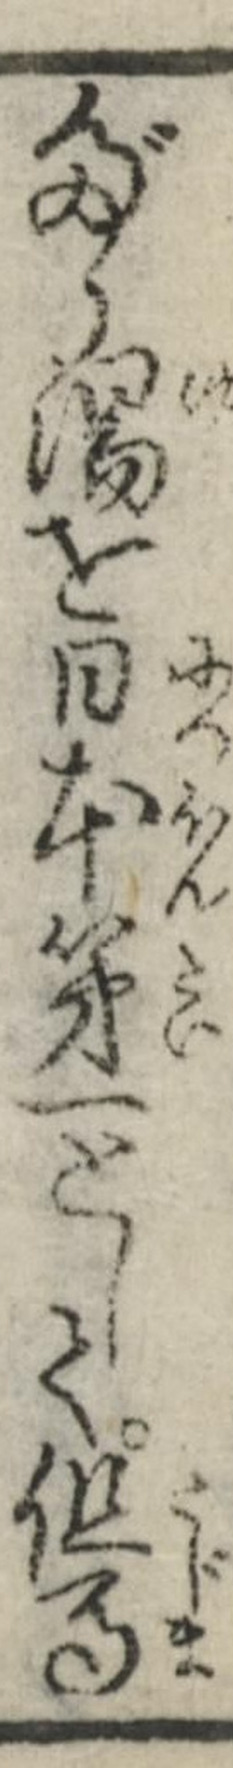だら湯を日本第一として。但馬
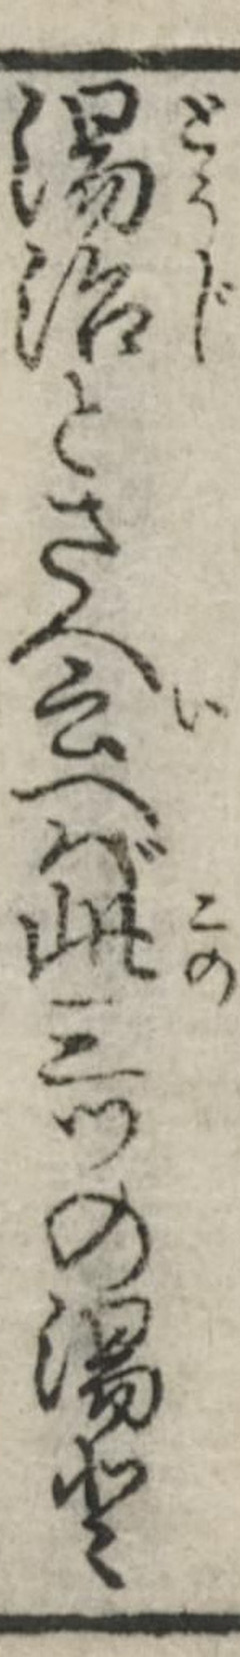湯治とさへ云へば此三ツの湯と
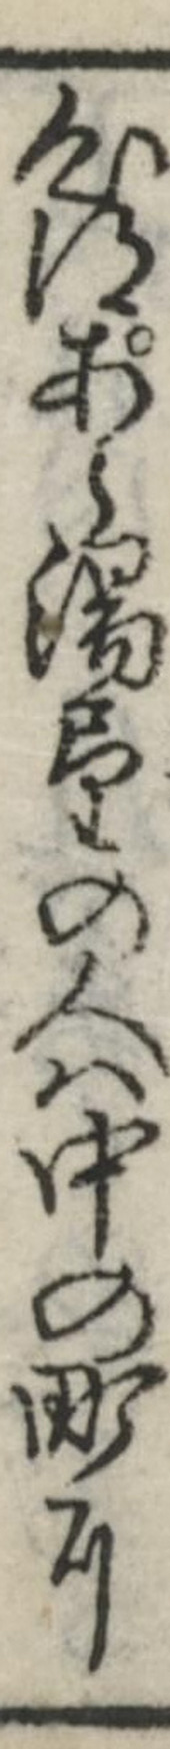心得。あら湯望の人は中の町に
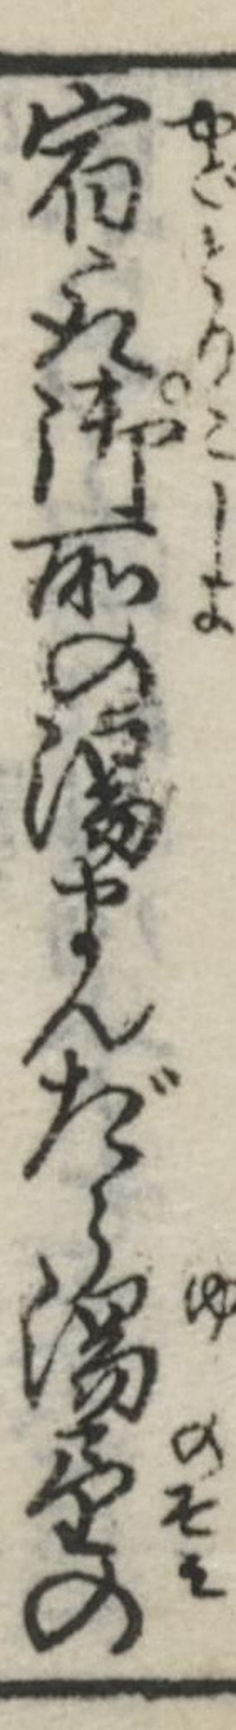宿取。御所の湯まんだら湯望の
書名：但州城崎浴湯辧
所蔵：東京大学地震研究所図書室 Earthquake Research Institute Library, The University of Tokyo, JAPAN
